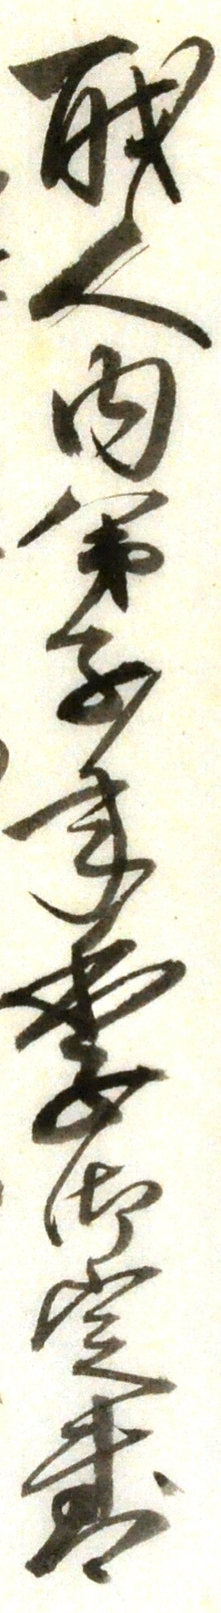職人内弟子年季御定書
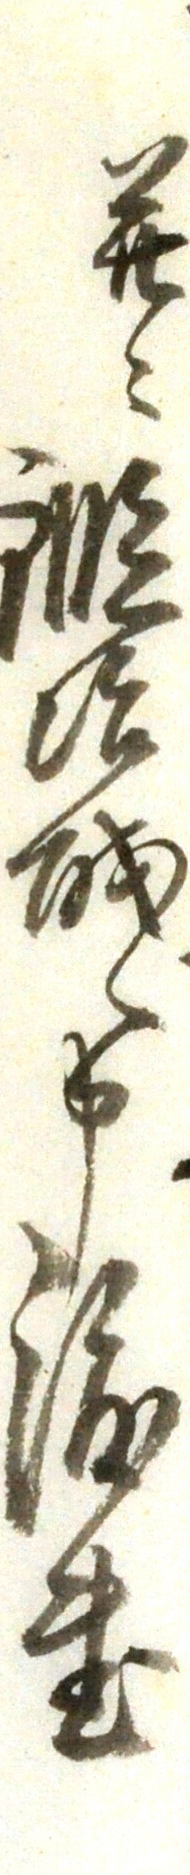并ニ鍛冶職へ申渡書

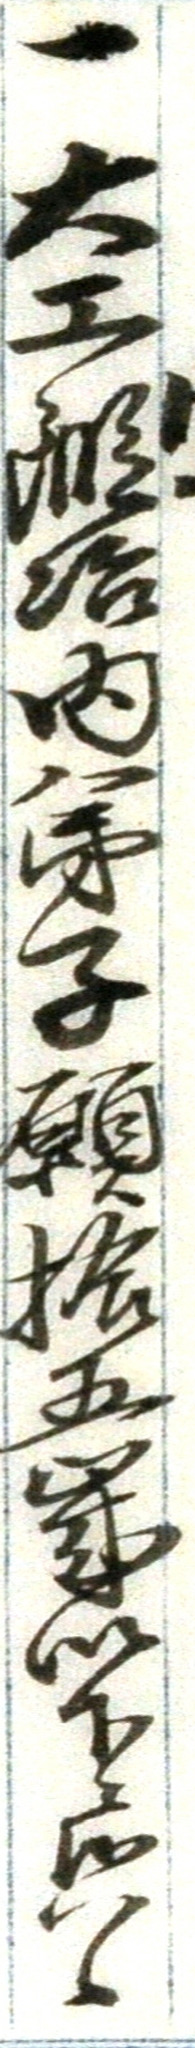一大工鍛冶内弟子願拾五歳以下ニ候ハハ
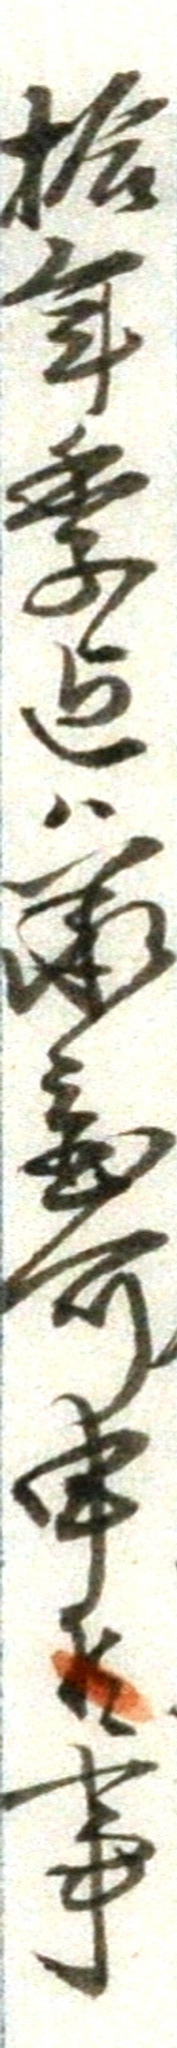拾年季迄ㇵ承置可申候事
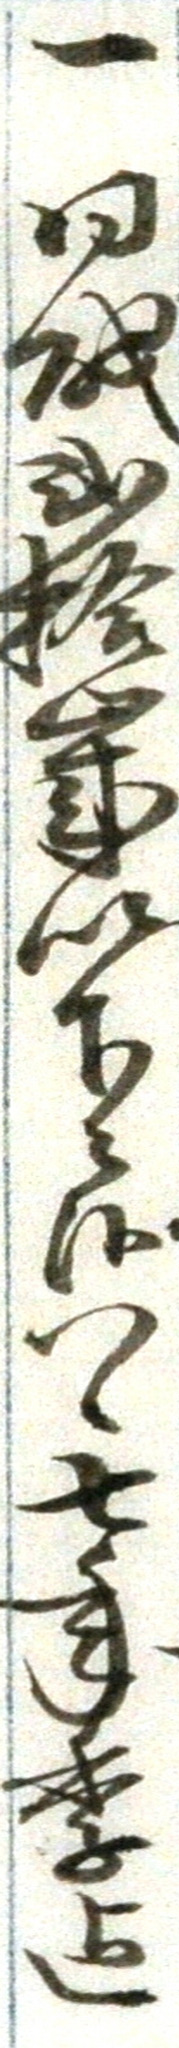一同儀弐拾歳以下ニ候ハハ七年季迄
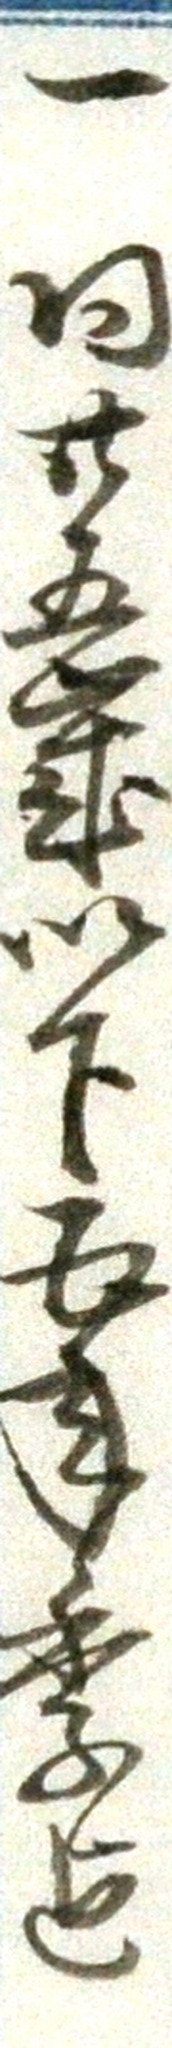一同廿五歳以下五年季迄
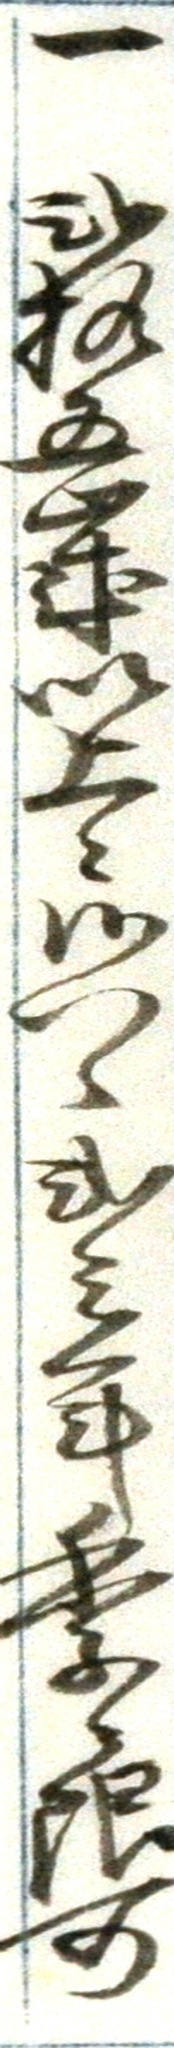一弐拾五歳以上ニ候ハハ弐三年季二限可
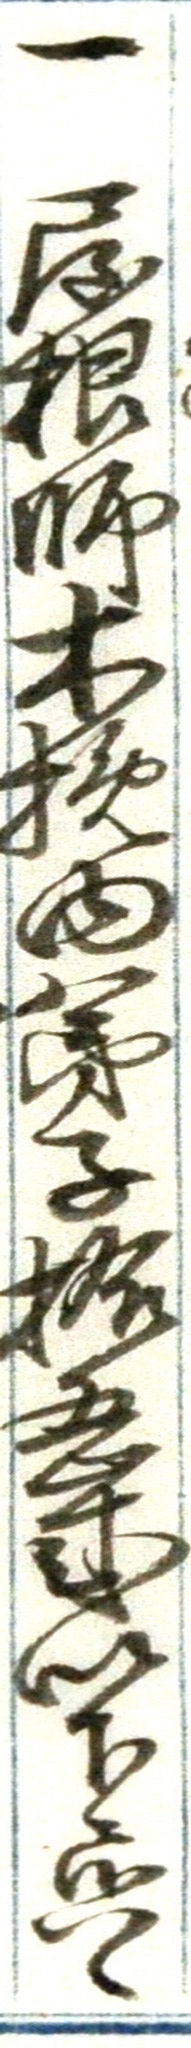一屋根師木挽内弟子拾五歳以下ニ候ハハ
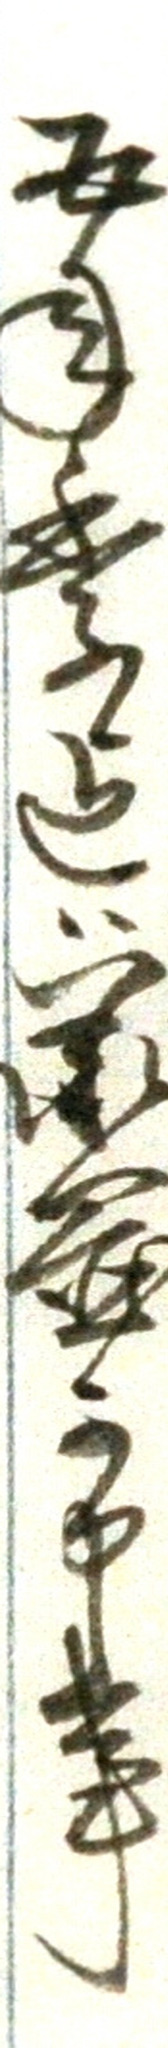五年季迄ㇵ承置可申事
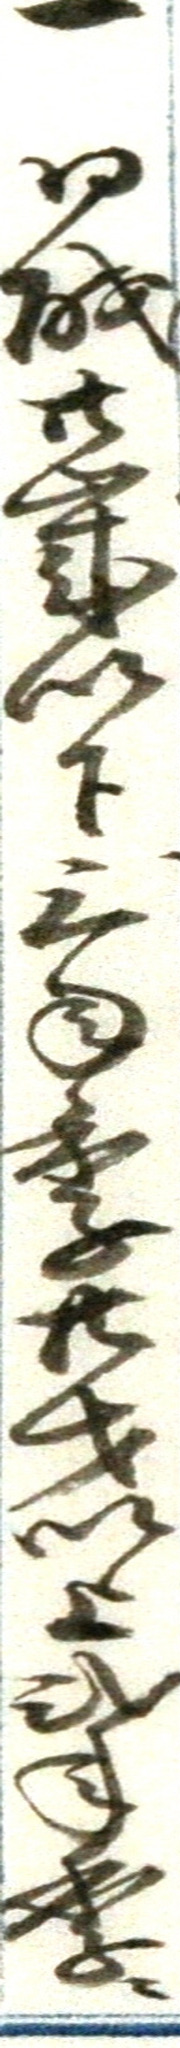一同職廿歳以下三年季廿才以上二年季二
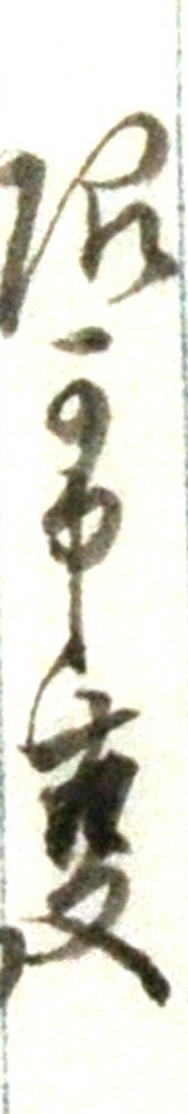限可申叓
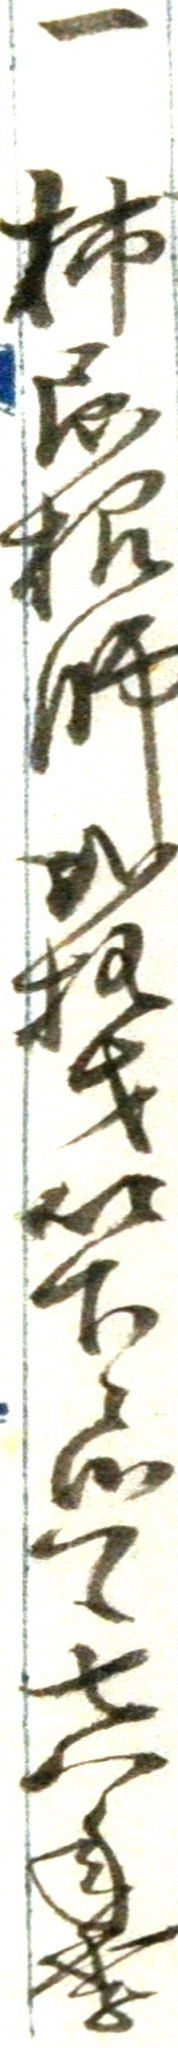一杮屋根師弐拾才以下二候ハハ七八年季迄

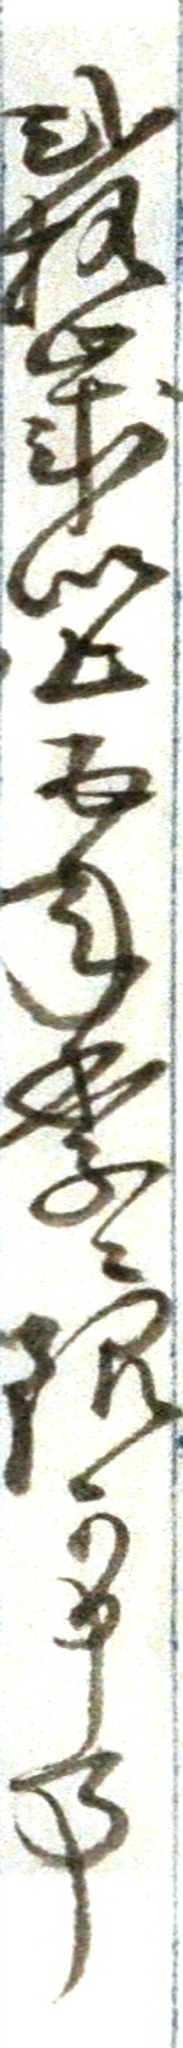弐拾歳以上両年季二限可申事
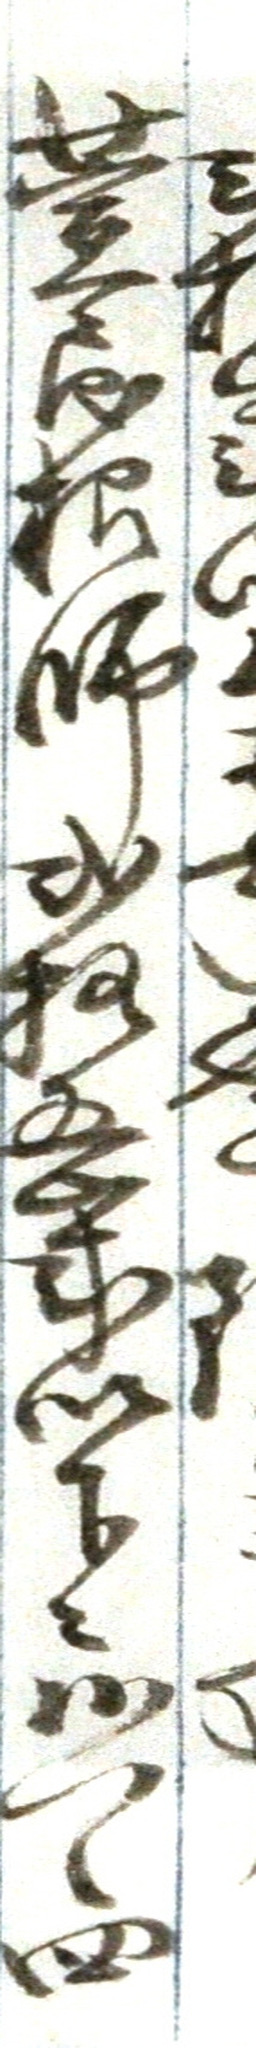一萱屋根師弐拾五歳以下ニ候ハハ四
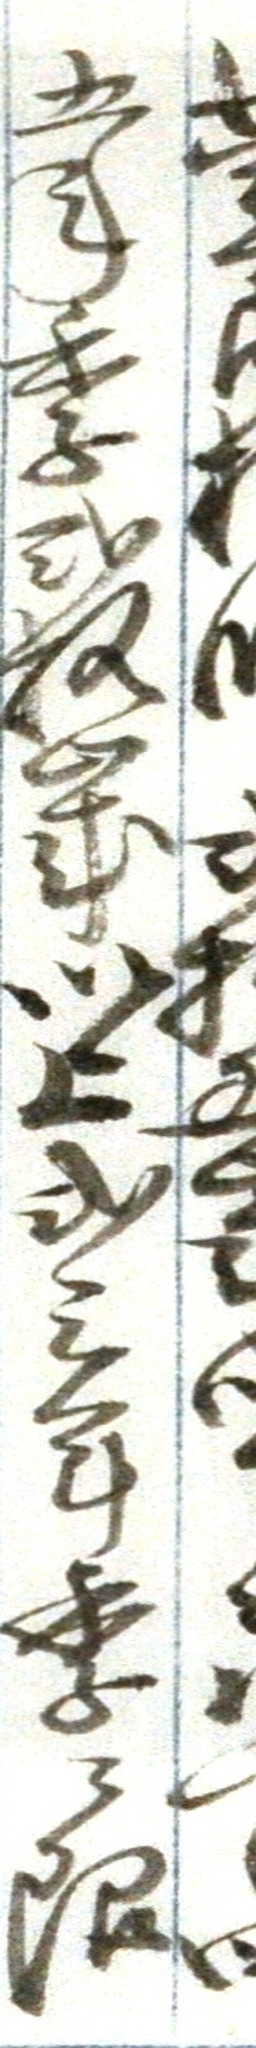五年季弐拾歳以上弐三年季ニ限り
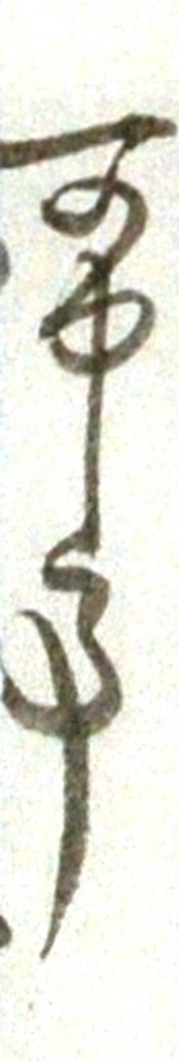可申事
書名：職人内弟子年季御定書并ニ鍛冶職ヘ申渡書
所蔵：伊那市立高遠町図書館・合同会社AMANE
